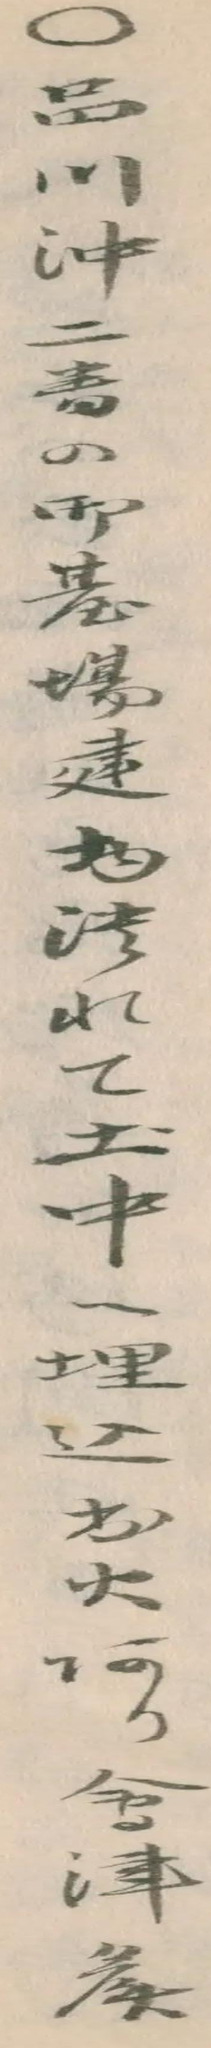〇品川沖二番の御台場建物潰れて土中へ埋込出火あり会津侯
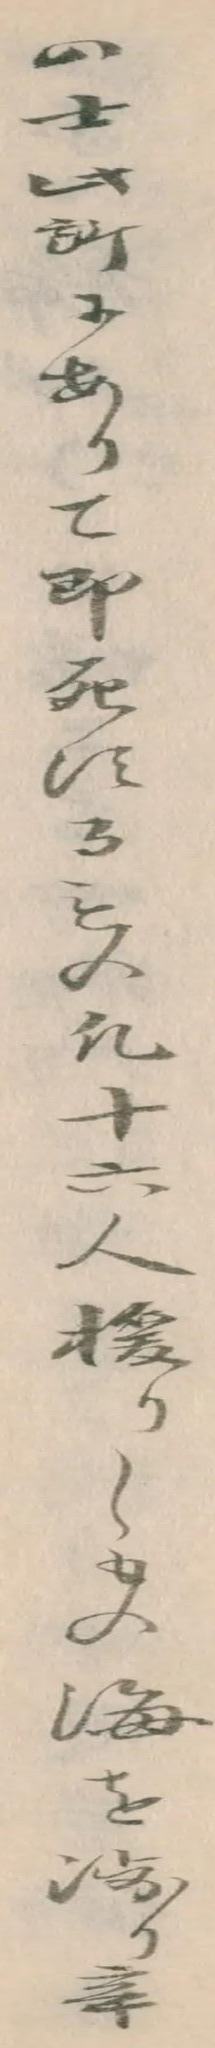の士此所にありて即死するもの凡十六人援りしもの海を渉り辛
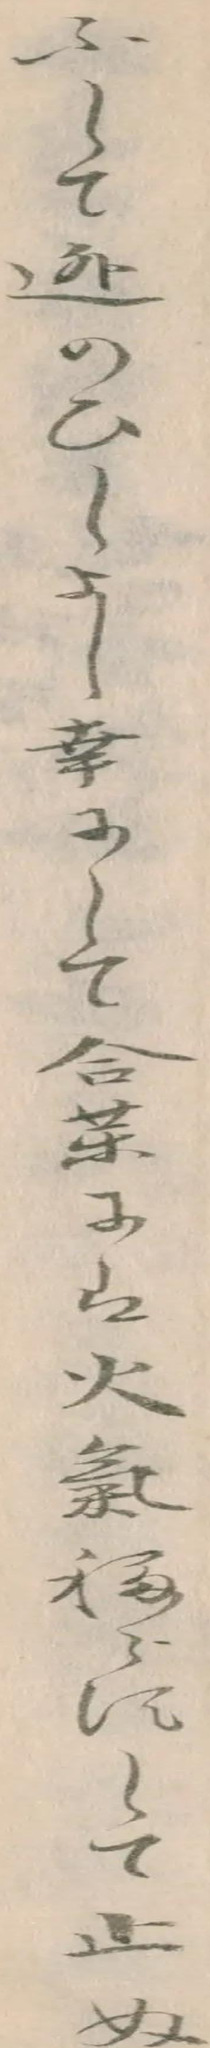ふして逃のひしよし幸にして合薬には火気移らすして止ぬ
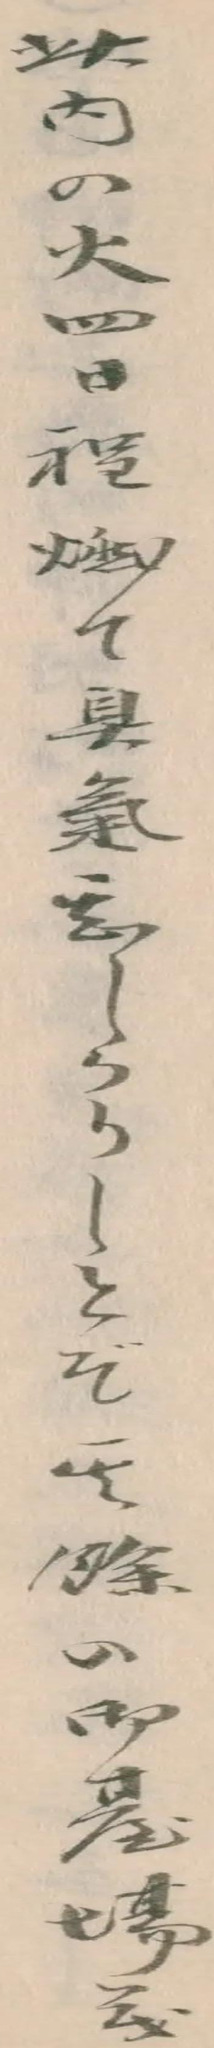此内の火四日程燃て臭気甚しかりしとぞ其余の御台場も
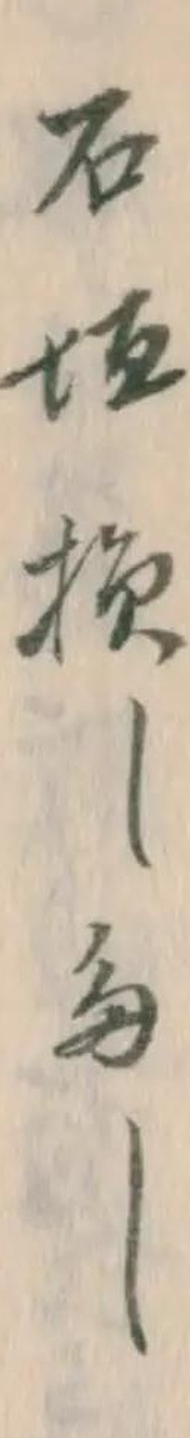石垣損し多し
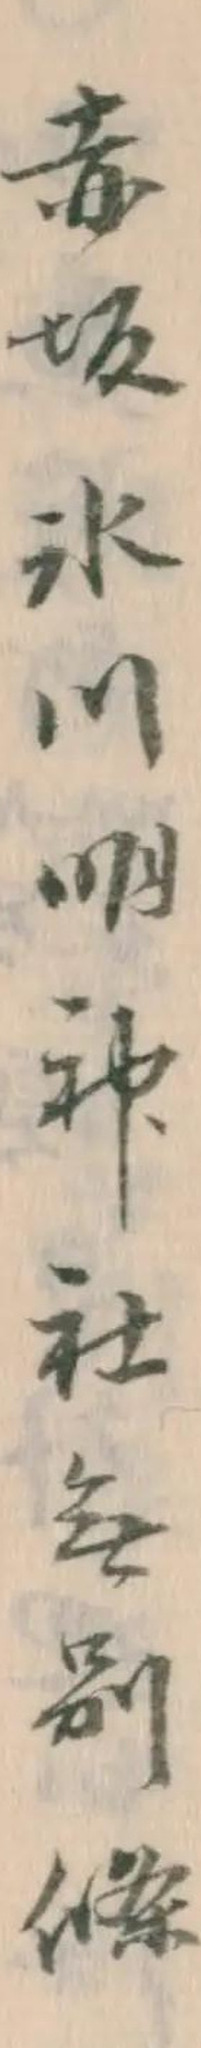赤坂氷川明神社無別條
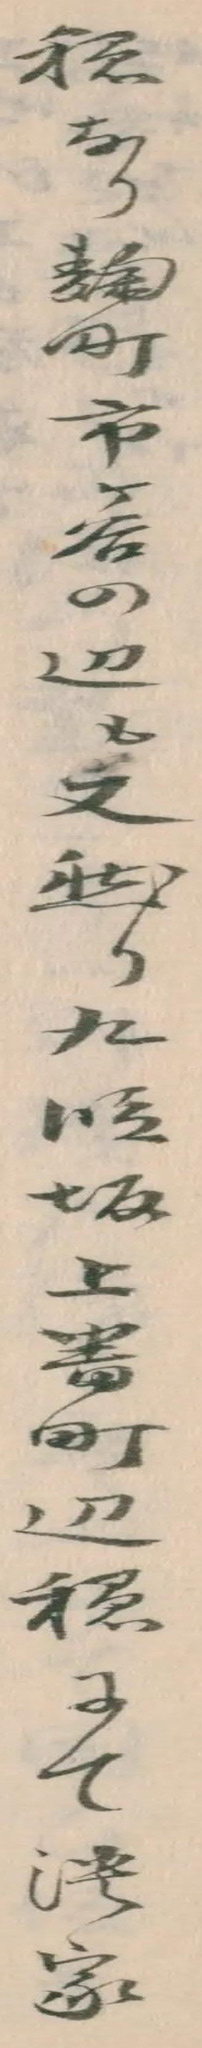穏なり麹町市ヶ谷の辺も又然り九段坂上番町辺穏にて潰家
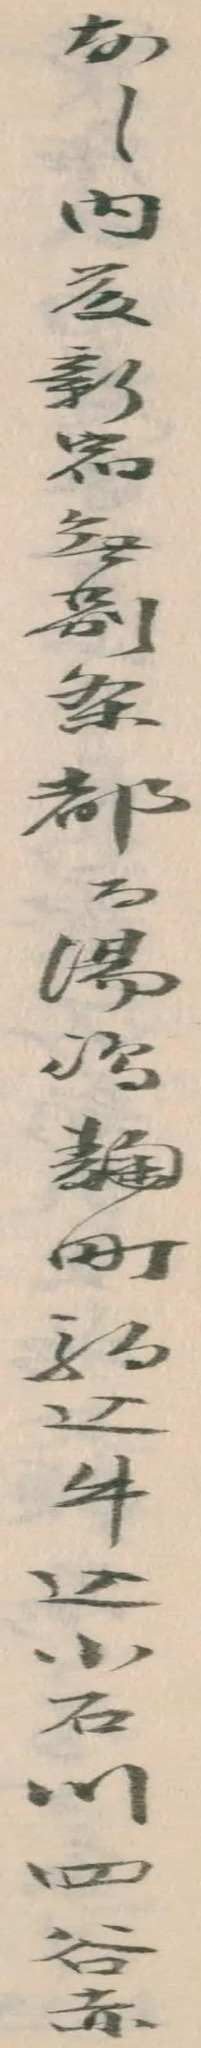なし内藤新宿無別条都而湯嶋麹町駒込牛込小石川四谷赤
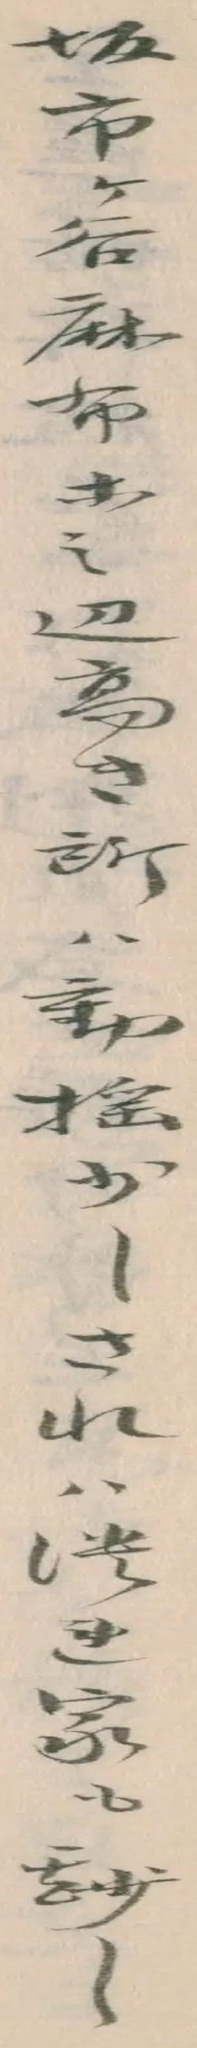坂市ヶ谷麻布等之辺高き所は動揺少しされは潰れ家も尠し
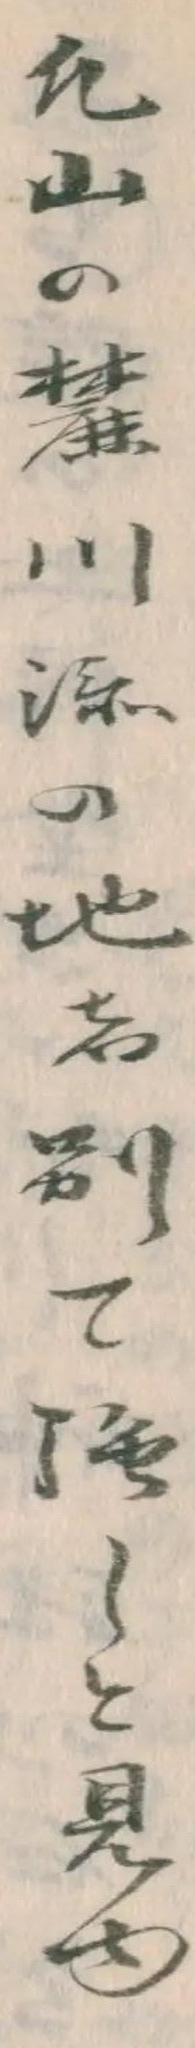凡山の麓川沿添の地は別て強しと見ゆ
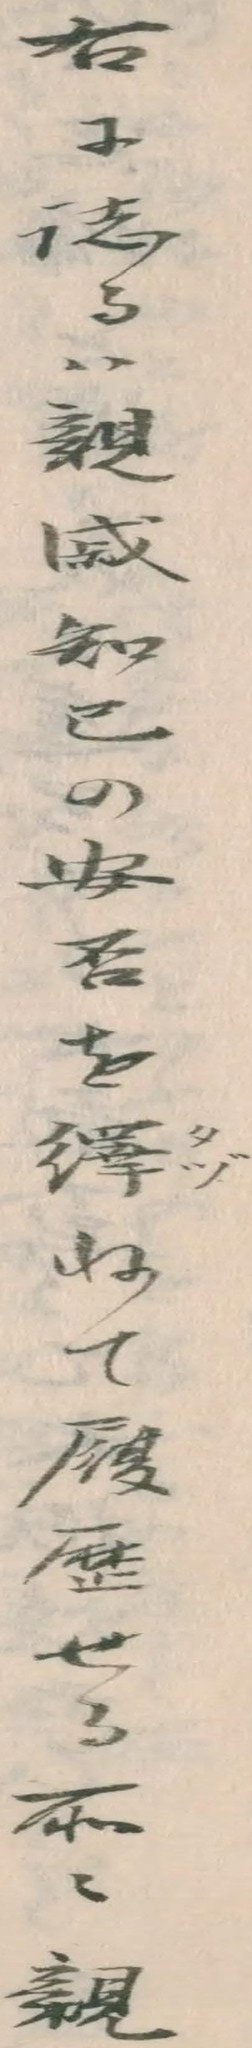右に誌るは親戚知己の安否を繹ねて履歴せる所々親
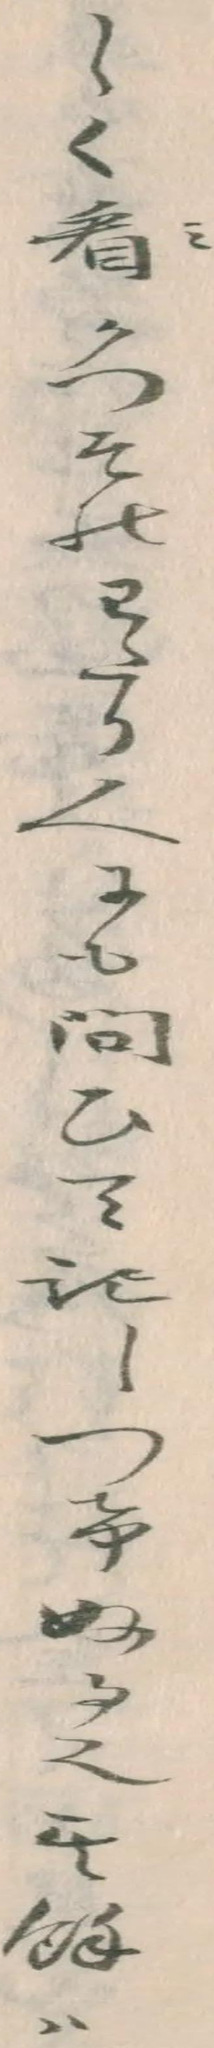しく看かつそのわたり人にも問ひて記しつけぬる也其余は
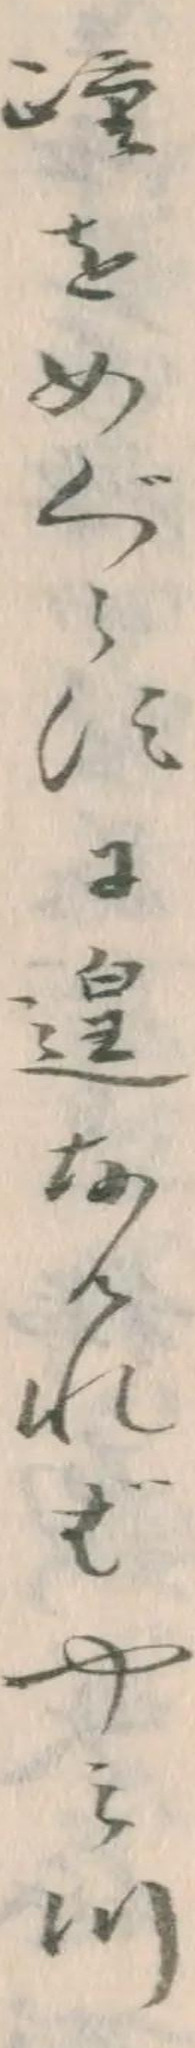踵をめぐらすに遑なければやみつ
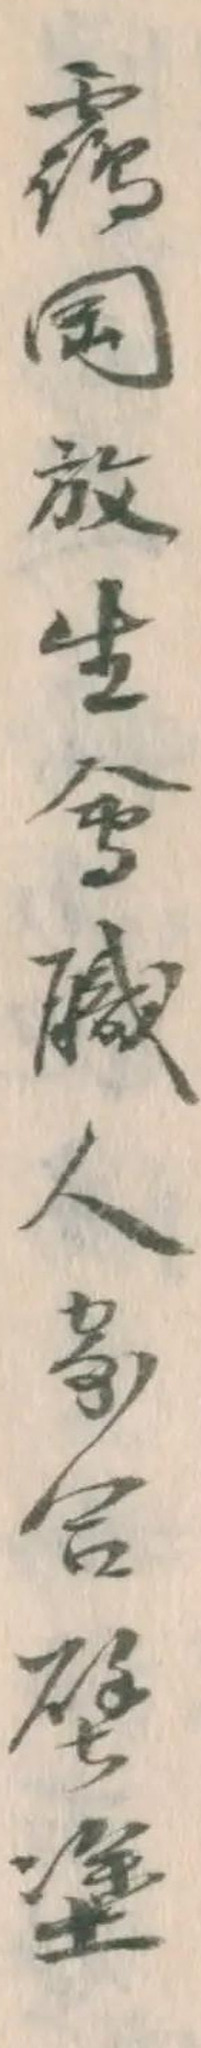鶴岡放生会職人寄合壁塗
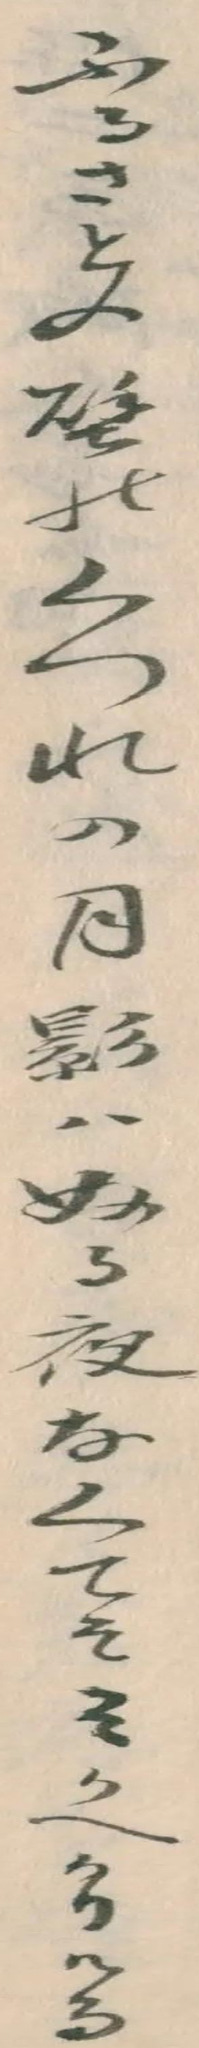ふるさとの壁のくつれの月影はぬる夜なくてそみかへかりける

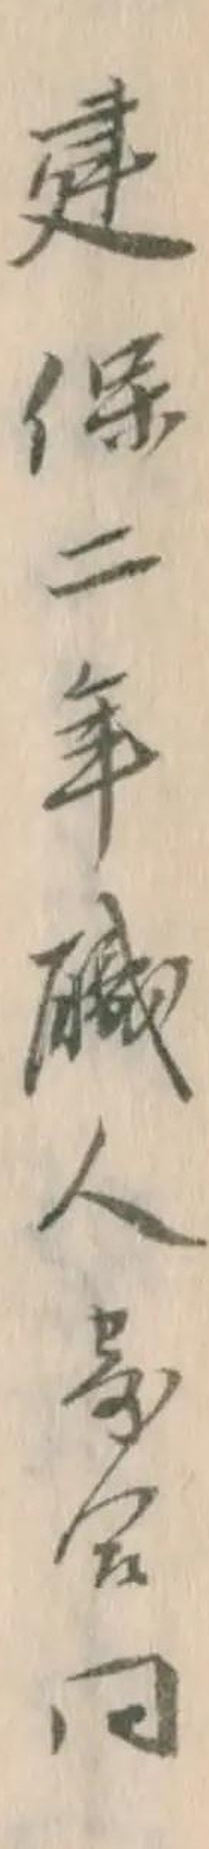建保二年職人寄合同
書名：地災撮要. 巻7-9(地震之部)
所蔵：国立国会図書館 National Diet Library, JAPAN
